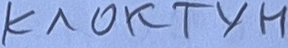клоктун
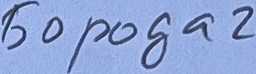бородач
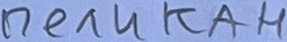пеликан
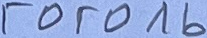гоголь
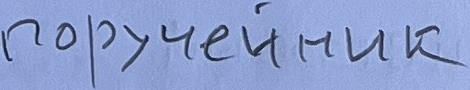поручейник
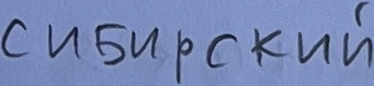сибирский
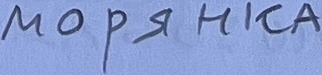морянка
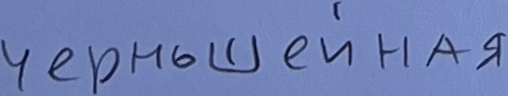черношейная
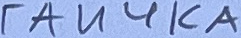гаичка
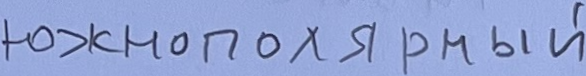южнополярный
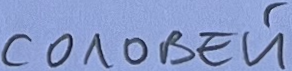соловей
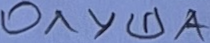олуша
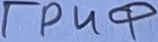гриф
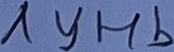лунь
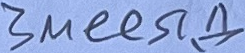змееяд
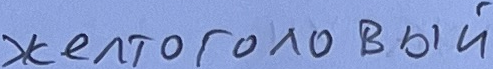желтоголовый
